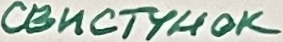свистунок
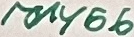голубь
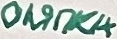оляпка
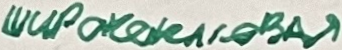ширококлювая
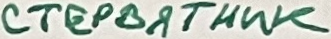стервятник
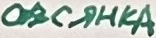овсянка
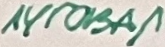луговая
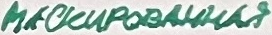маскированная
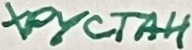хрустан
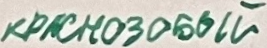краснозобый
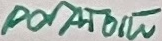рогатый
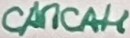сапсан
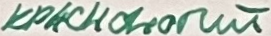красноногий
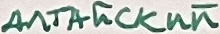алтайский
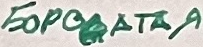бородатая
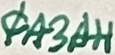фазан
